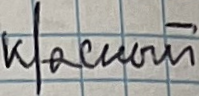красный
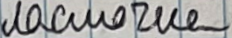ласточка
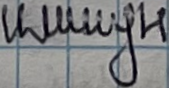кликун
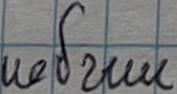кобчик
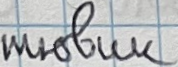тювик
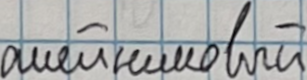ошейниковый
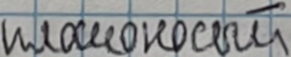плосконосый
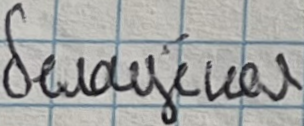белощёкая
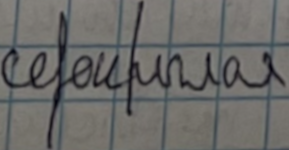серокрылая
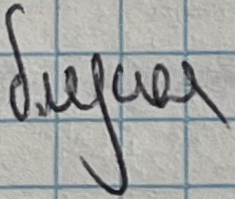бледная
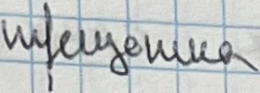трещотка
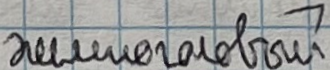желтоголовый
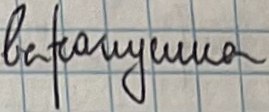варакушка
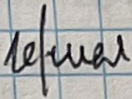горная
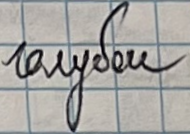голубок
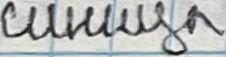синица
